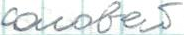соловей
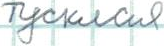тусклая
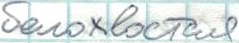белохвостая
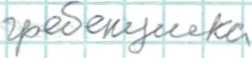гребенушка
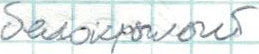белокрылый
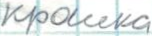крошка
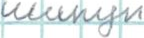шипун
